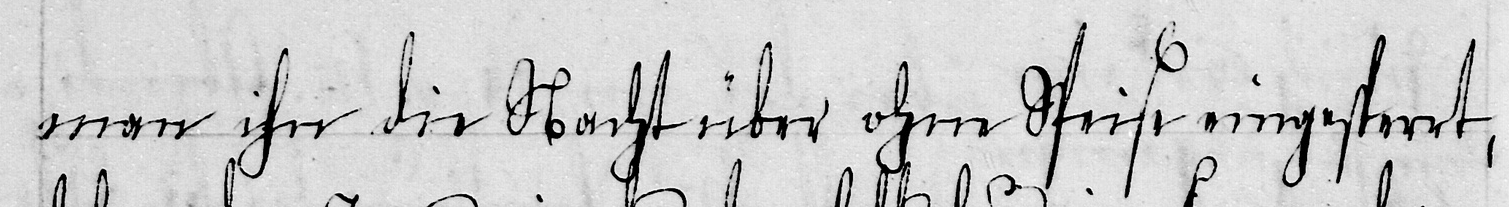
man ihn die Nacht über ohne Speise eingesperrt,
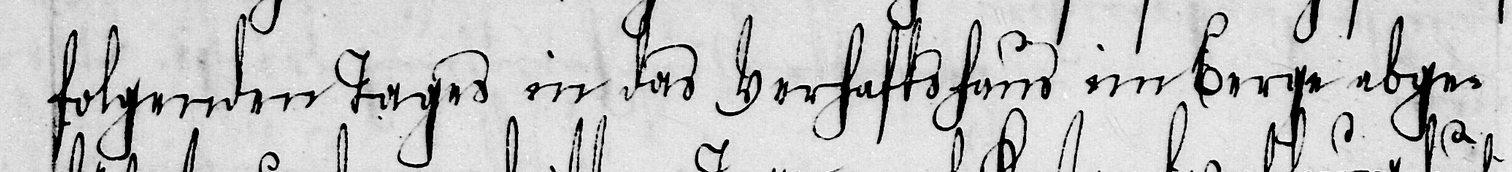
folgenden Tages in das Verhaftshaus im Berge abge¬
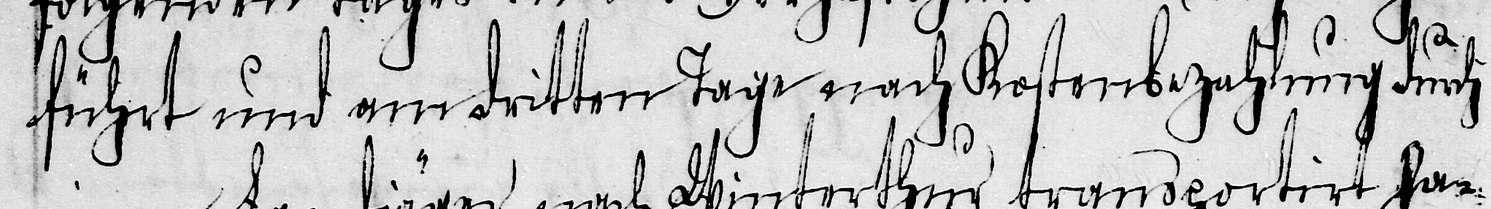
führt und am dritten Tage nach Kostenbezahlung durch
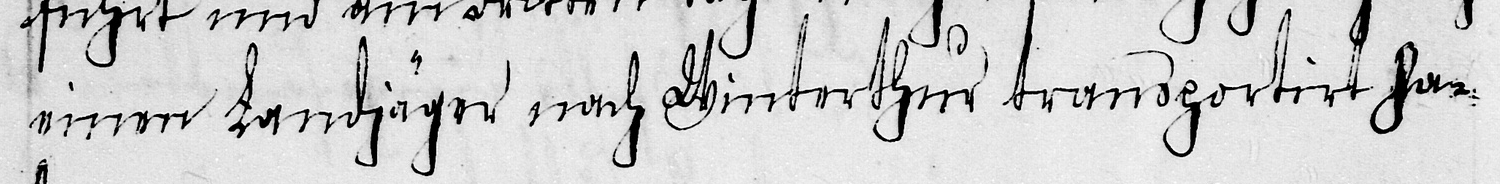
einen Landjäger nach Winterthur transportirt ha¬
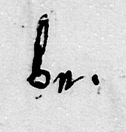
be.
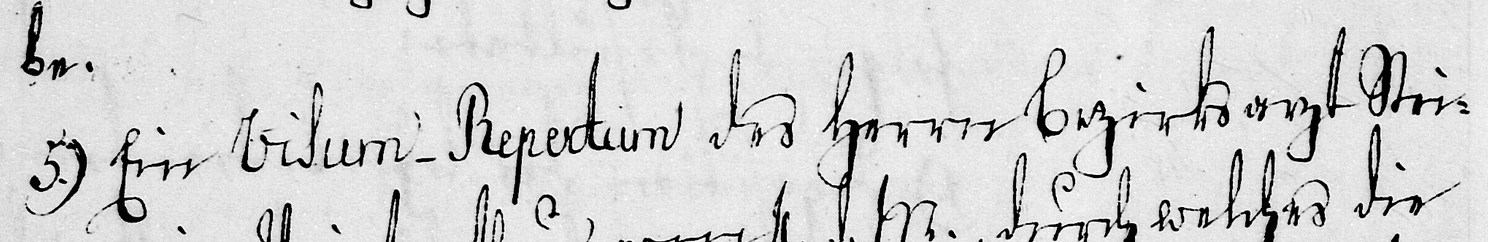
5.) Ein Visum-Repertum des Herrn Bezirksarzt Stei¬
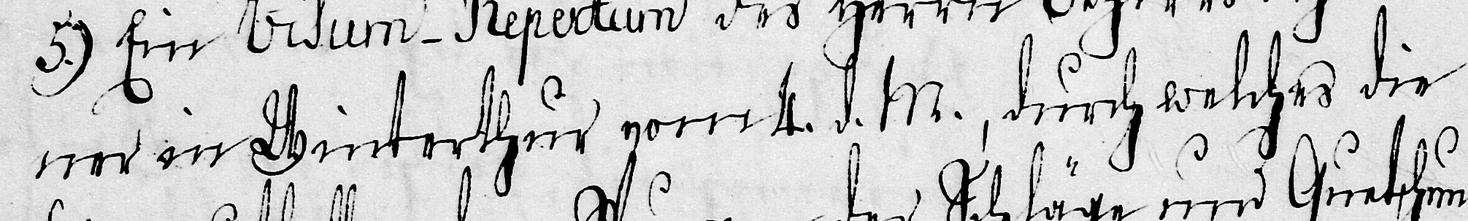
ner in Winterthur vom 4. d. M., durch welches die
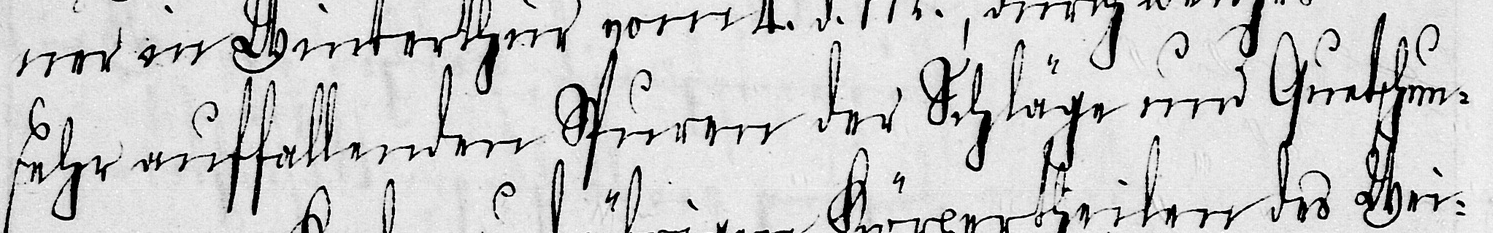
sehr auffallenden Spuren der Schläge und Quetschun¬
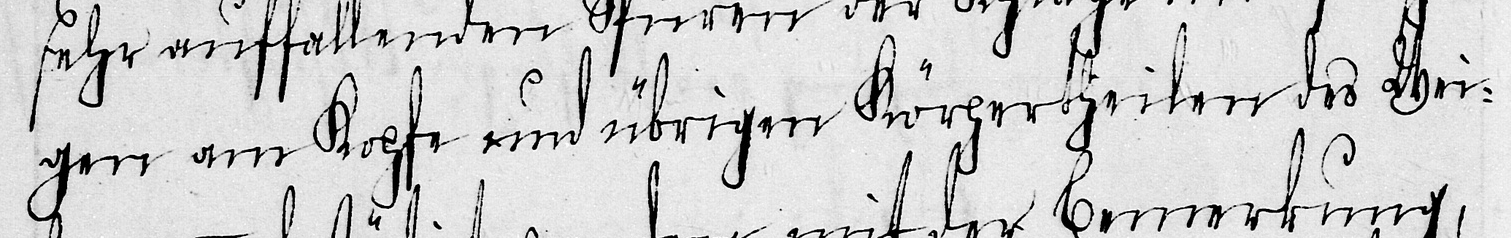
gen am Kopfe und übrigen Körpertheilen des Wei¬
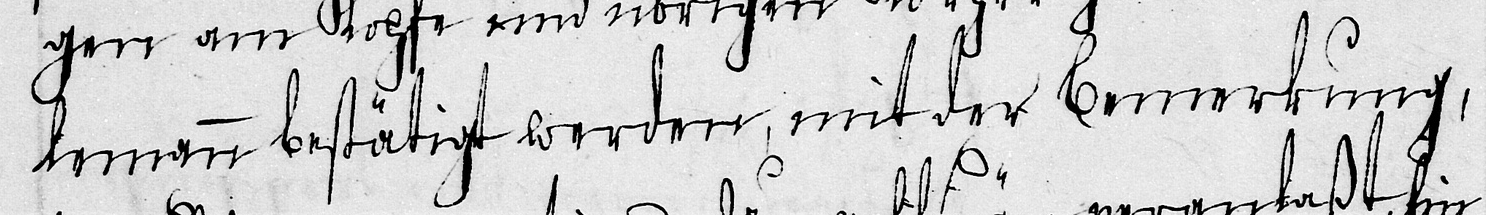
lemann bestätigt werden, mit der Bemerkung,
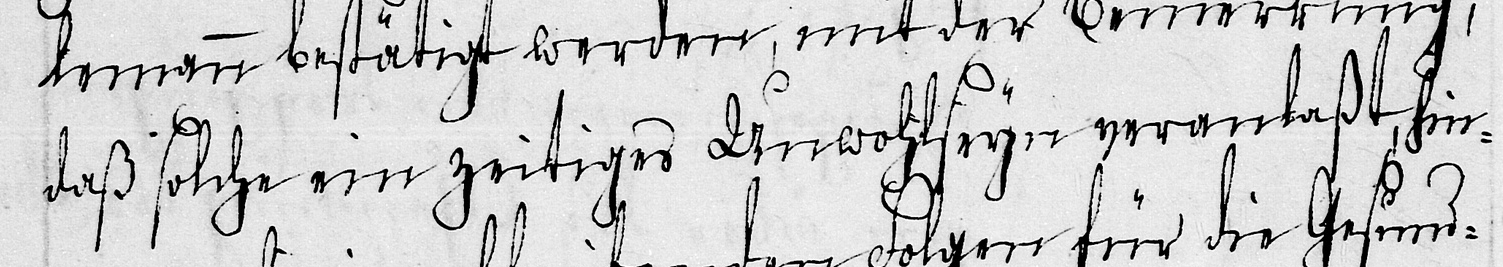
daß solche ein zeitiges Unwohlseyn veranlaßt, hin¬
